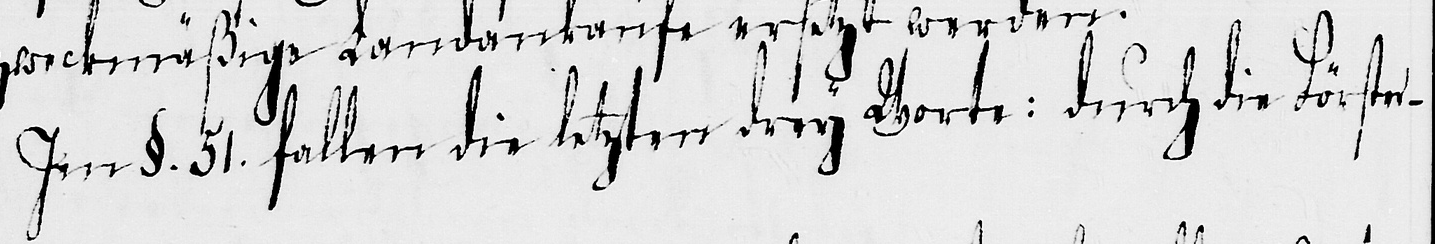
Im §. 51. fallen die letzten drey Worte: durch die Förster
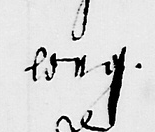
weg.
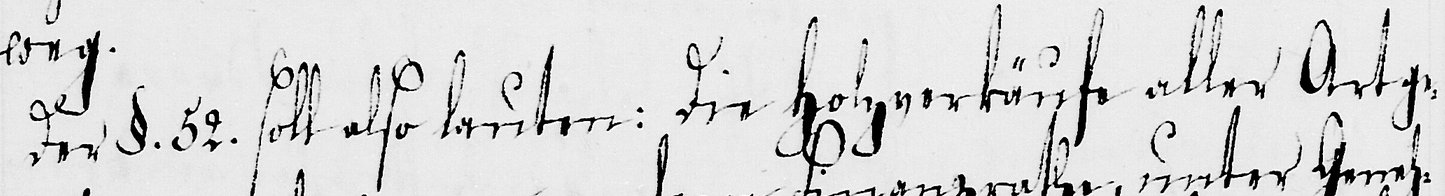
Der §. 52. soll also lauten: Die Holzverkäufe aller Art g¬
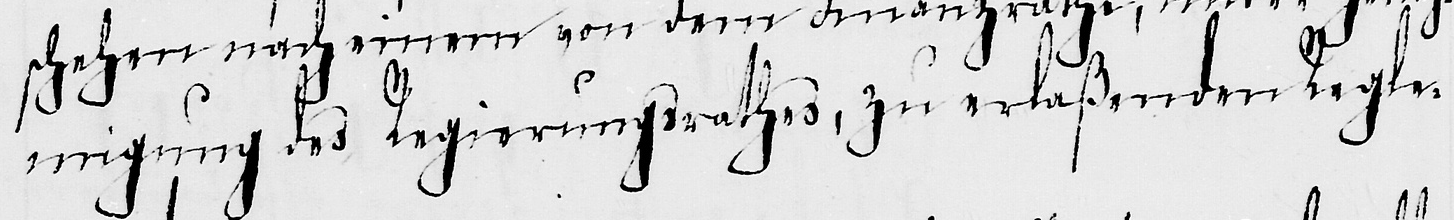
migung des Regierungsrathes, zu erlaßenden Regle¬
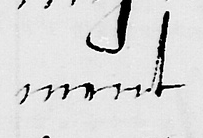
men¬
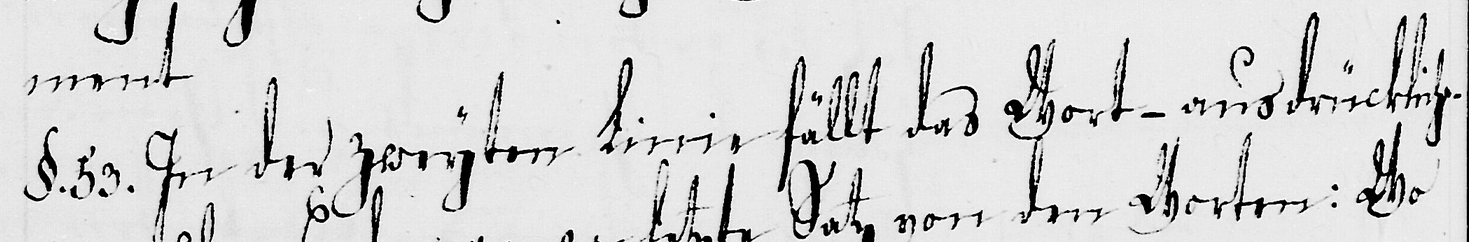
§. 53. In der zweyten Linie fällt das Wort – ausdrücklic¬
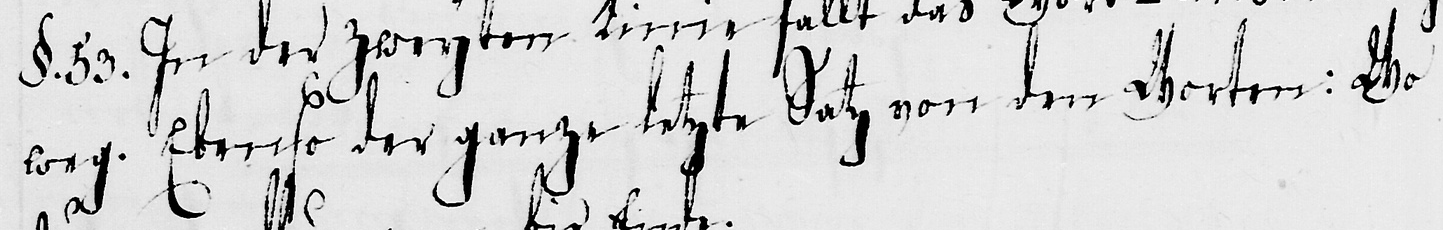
weg. Ebenso der ganze letzte Satz von den Worten: Wo
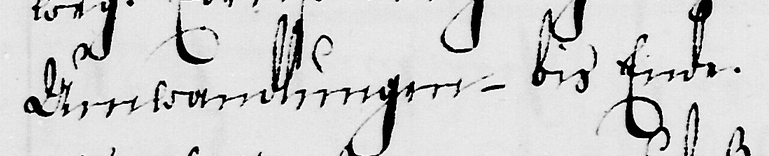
Umwandlungen – bis Ende.
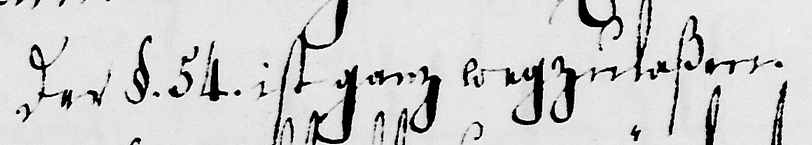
Der §. 54. ist ganz wegzulaßen.
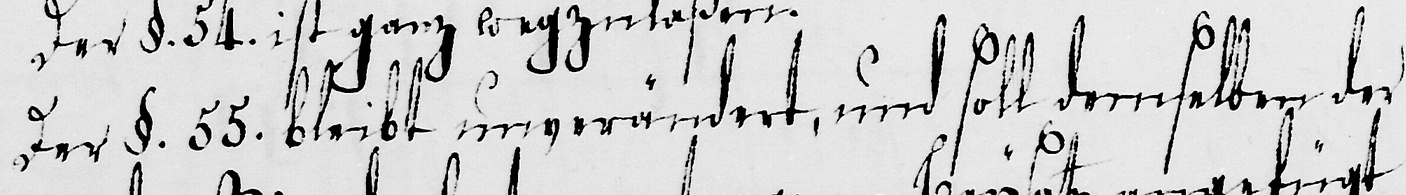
Der §. 55. bleibt unverändert, und soll demselben der
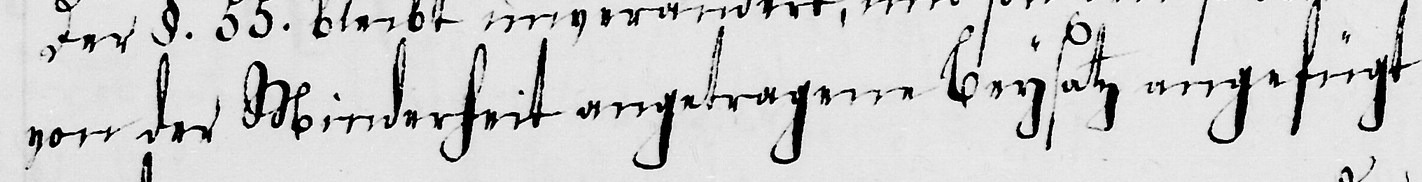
von der Minderheit angetragene Beysatz angefügt
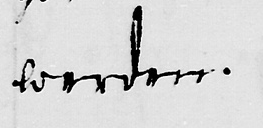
werden.
